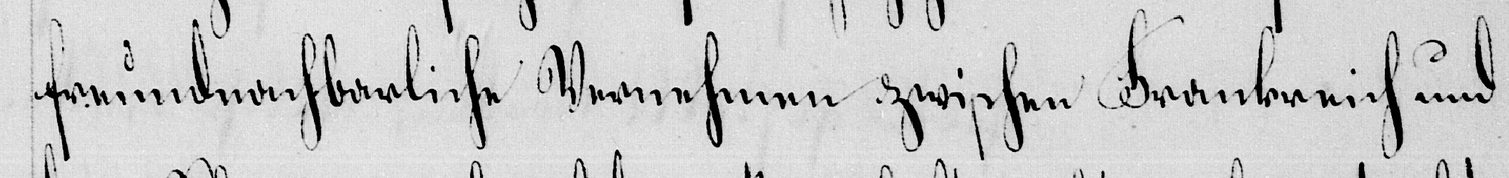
freundschaftliche Vernehmen zwischen Frankreich und
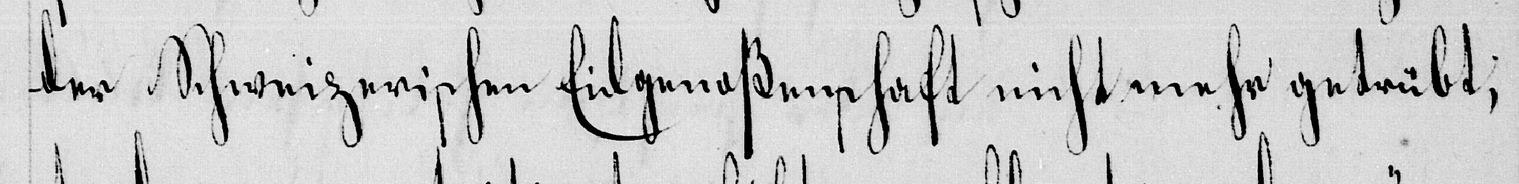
der Schweizerischen Eidgenoßenschaft nicht mehr getrübt,
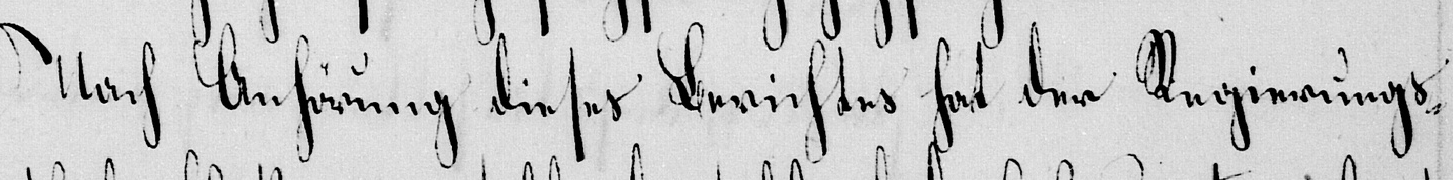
Nach Anhörung dieses Berichtes hat der Regierungs¬
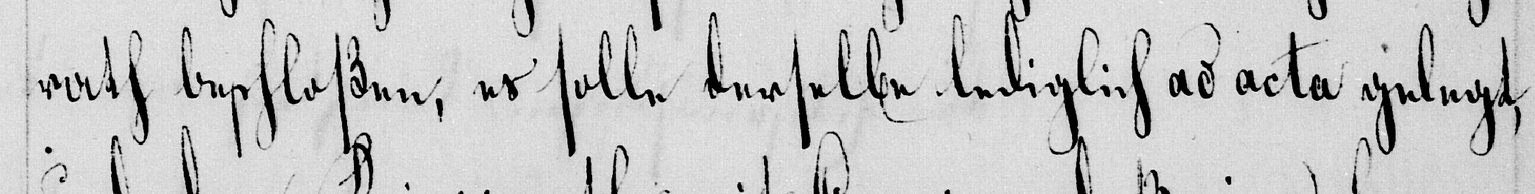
rath beschloßen, es solle derselbe lediglich ad acta gelegt,
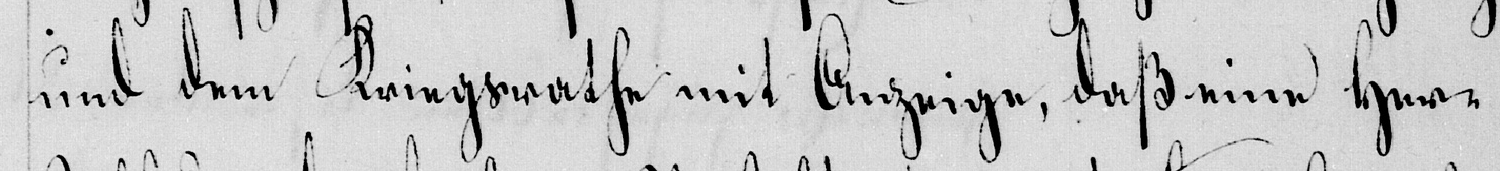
und dem Kriegsrathe mit Anzeige, daß eine Her¬
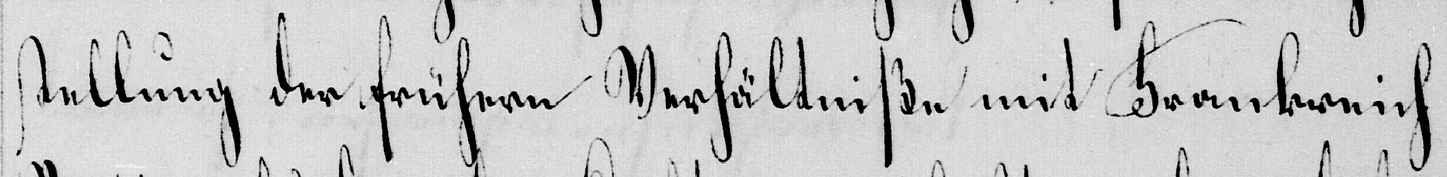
stellung der frühern Verhältniße mit Frankreich
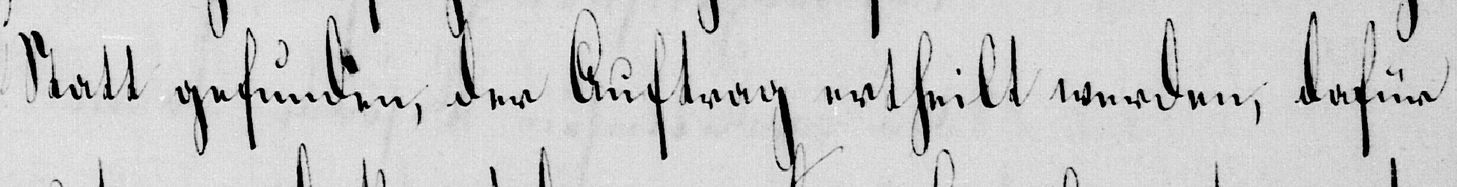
Statt gefunden, der Auftrag ertheilt werden, dafür
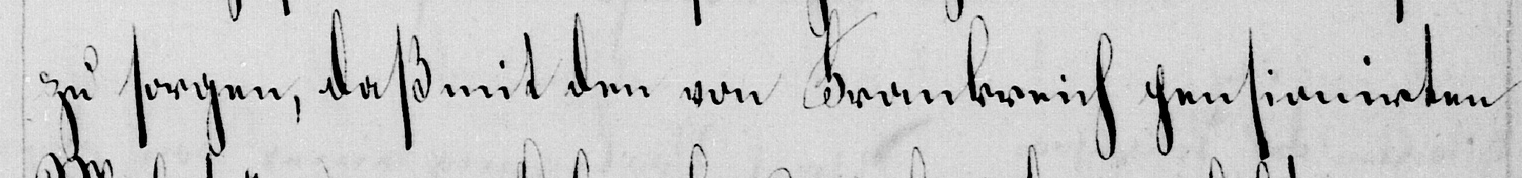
zu sorgen, daß mit den von Frankreich pensionirten
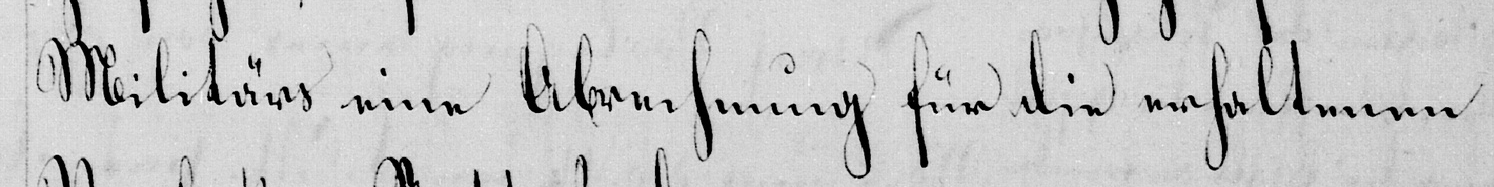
Militärs eine Abrechnung für die erhaltenen
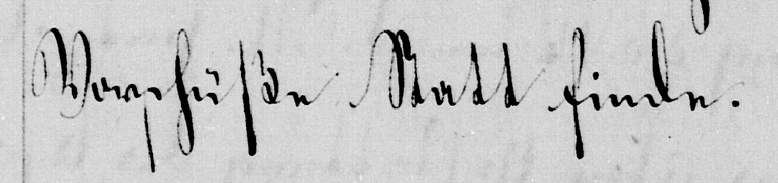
Vorschüße Statt finde.
